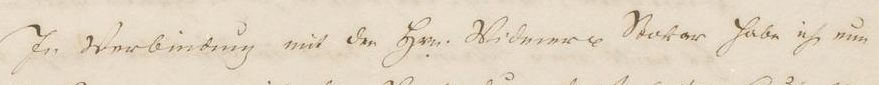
In Verbindung mit den Hrn. Widmer & Stokar habe ich nun
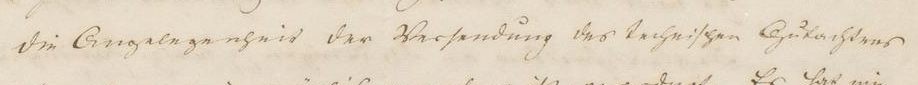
die Angelegenheit der Versendung des technischen Gutachtens
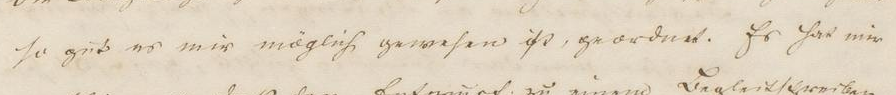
so gut es mir möglich gewesen ist, geordnet. Es hat mir
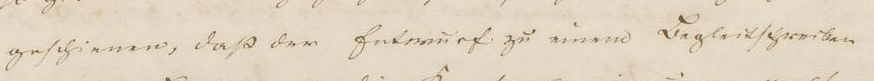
geschienen, daß der Entwurf zu einem Begleitschreiben
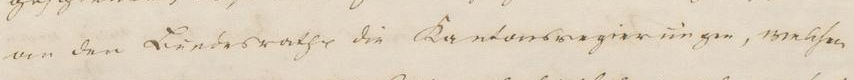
an den Bundesrath & die Kantonsregierungen, welche
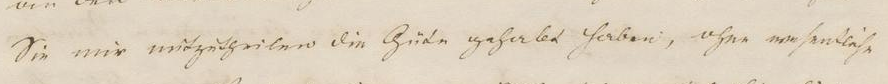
Sie mir mitzutheilen die Güte gehabt haben, ohne wesentliche
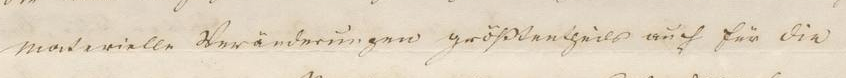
materielle Veränderungen größtentheils auch für die
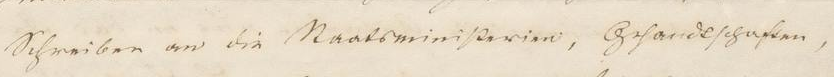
Schreiben an die Staatsministerien, Gesandtschaften,
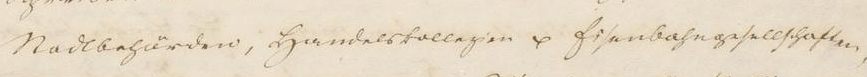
Stadtbehörden, Handelskollegien & Eisenbahngesellschaften,
